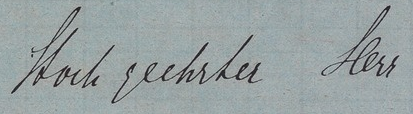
Hochgeehrter Herr
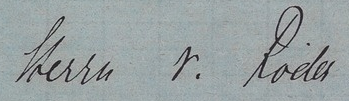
Herrn v. Röder
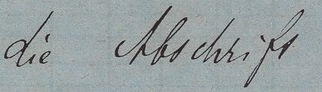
die Abschrift
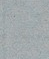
von
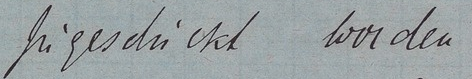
zugeschickt worden
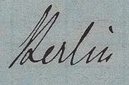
welche
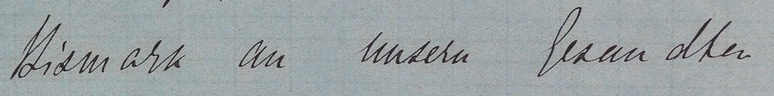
Bismark an unsern Gesandten
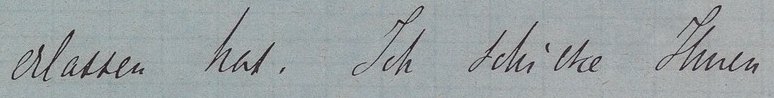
erlassen hat. Ich schicke Ihnen
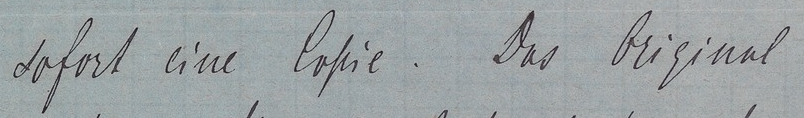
sofort ein Copie. Das Original
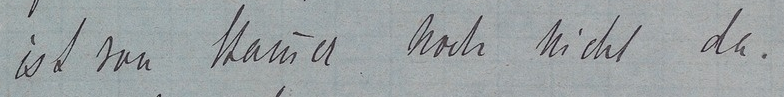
ist von Hammer noch nicht da.
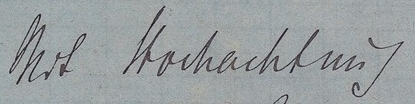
Mit Hochachtung
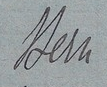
Welti
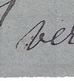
Febr.
